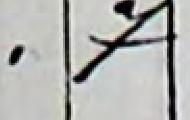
7
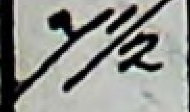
7 ½
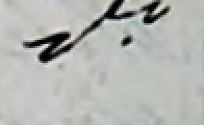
do
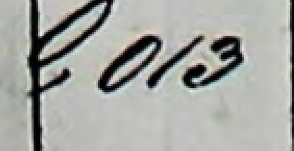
0,013
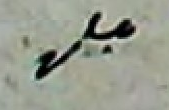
do
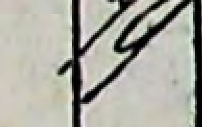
79
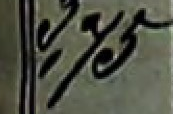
3,75
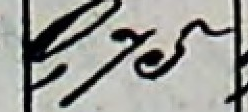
0,75
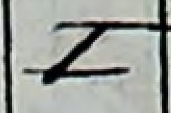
I
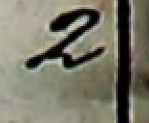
2
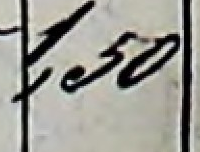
1,50
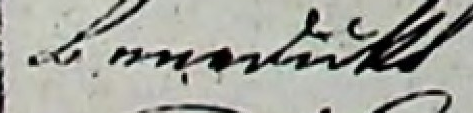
Benedukt
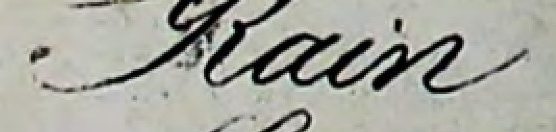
Kain
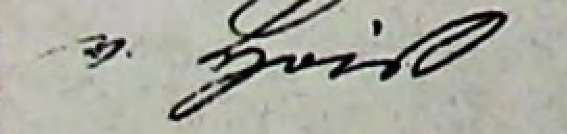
v. Hois
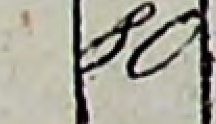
80
